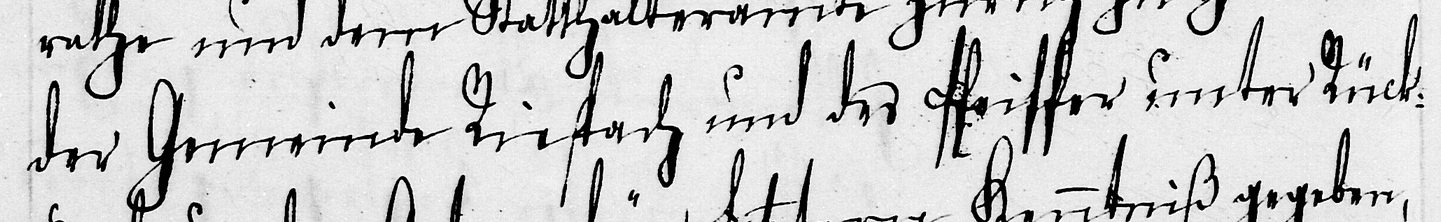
der Gemeinde Riespach und des Pfeiffer unter Rück¬
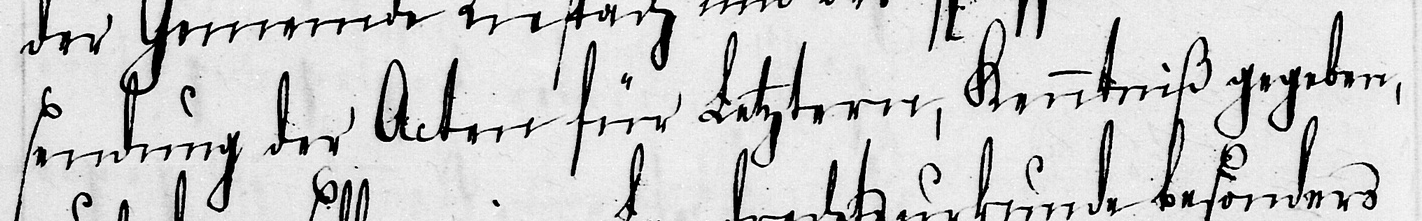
sendung der Acten für Letztern, Kenntniß gegeben,
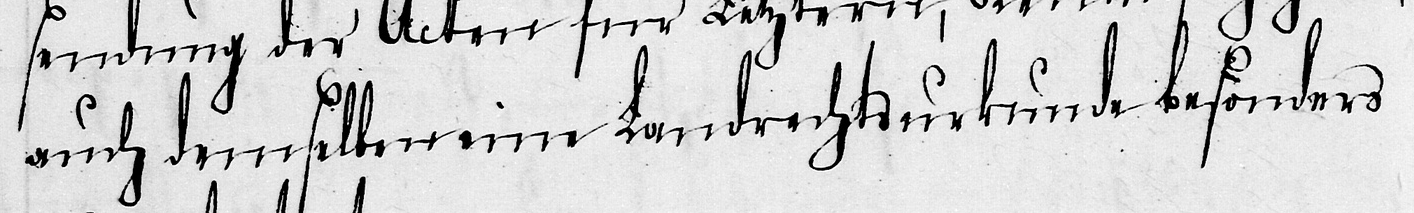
auch demselben eine Landrechtsurkunde besonders
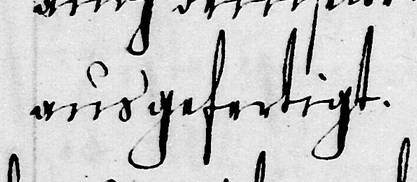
ausgefertigt.
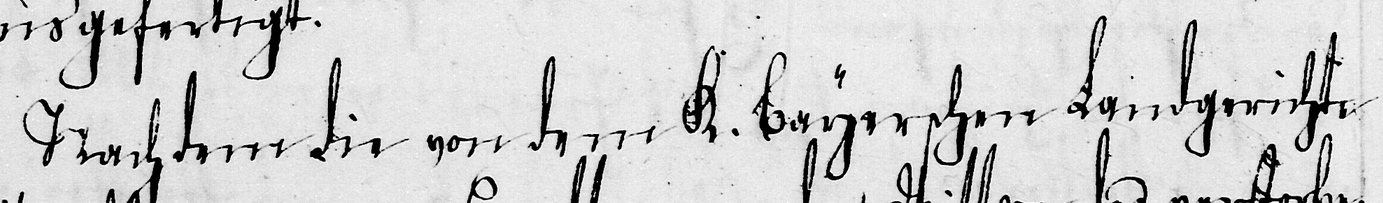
Nachdem die von dem K. Bayerschen Landgerichte
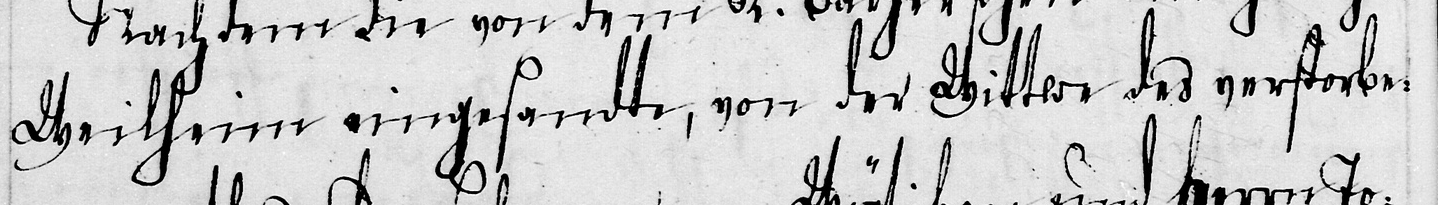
Weilheim eingesandte, von der Wittwe des verstorbe¬
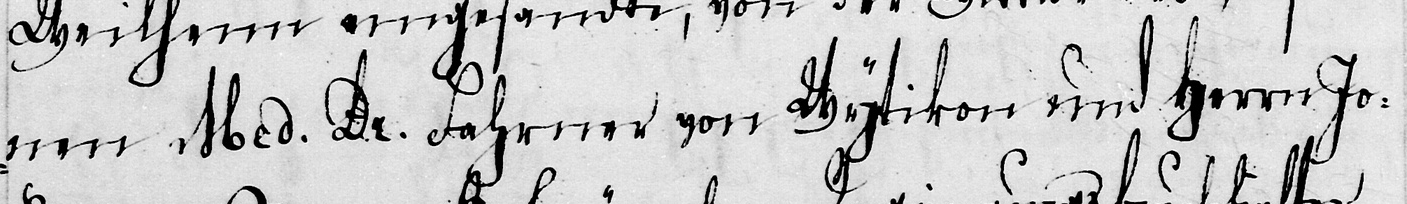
nen Med. Dr. Fahrner von Wytikon und Herrn Jo¬
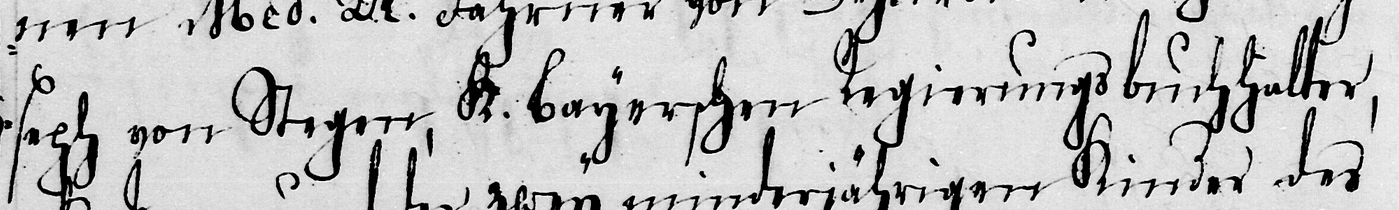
seph von Stegen, K. Bayerschen Regierungsbuchhalter,
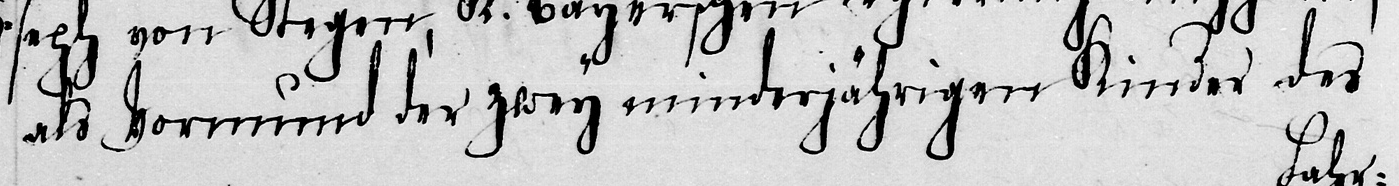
als Vormund der zwey minderjährigen Kinder des
